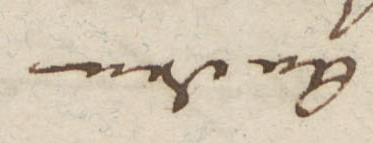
An den Aussenwa die
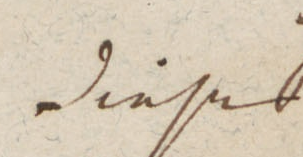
die diesen
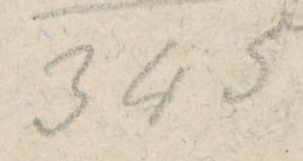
100.
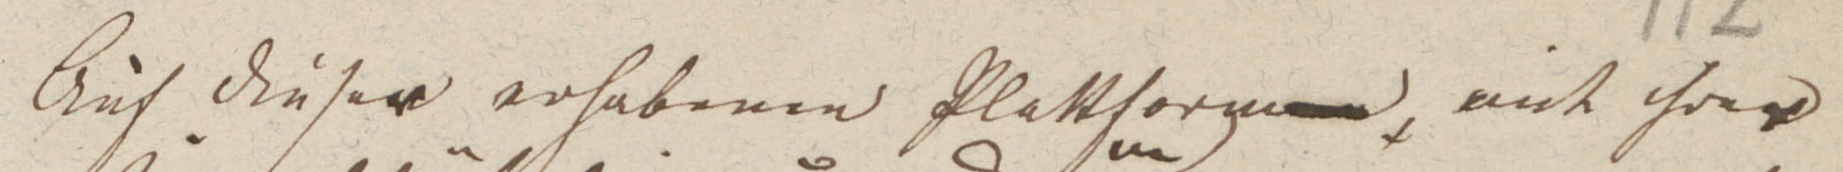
Auf diesenr erhabenen Plattformen, mit ihrenr
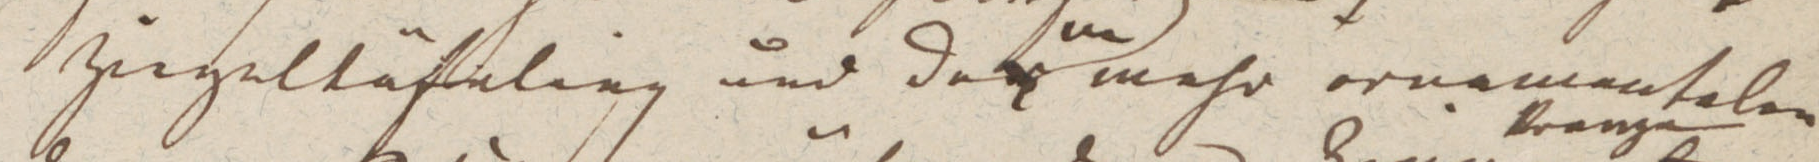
Ziegeltäfelung und derm mehr ornamentalen
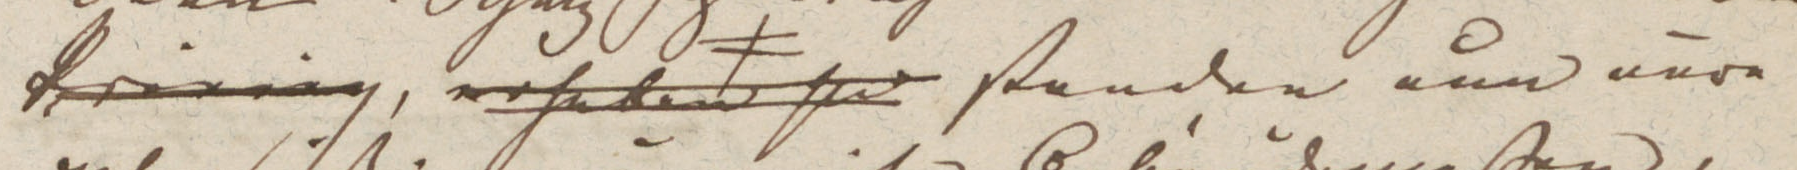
krönung, erhaben sind % standen nun unre-
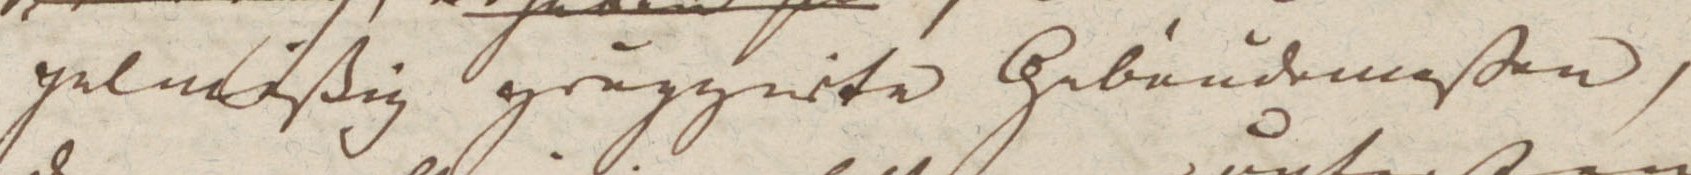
gelmässig gruppirte Gebäudemassen,
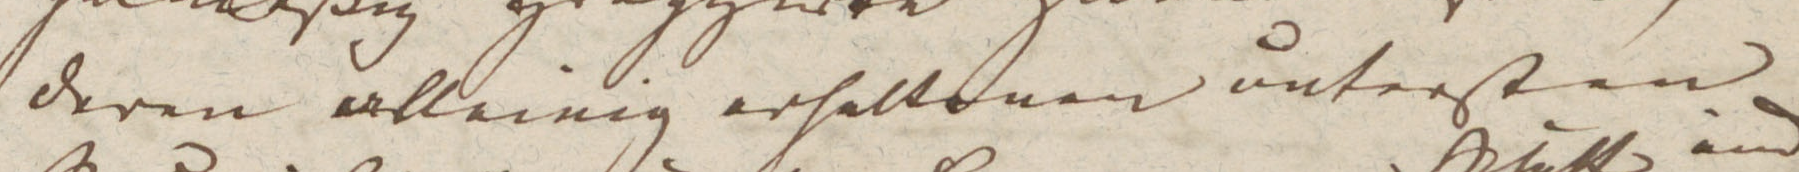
deren lleinig erhaltenen untersten
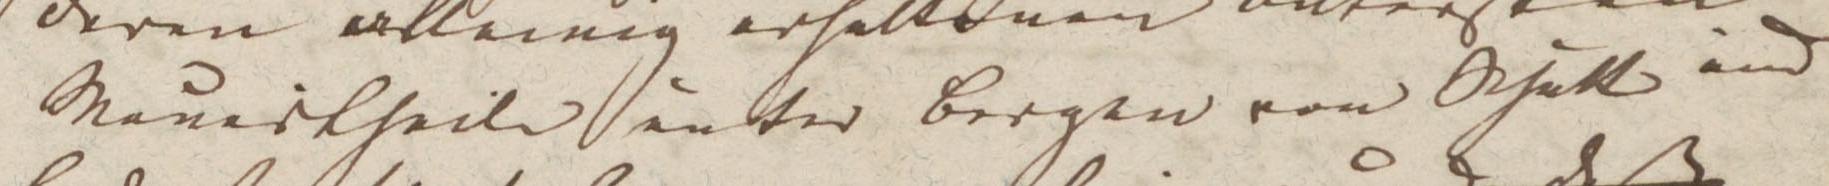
Mauertheile unter Bergen von Schutt und
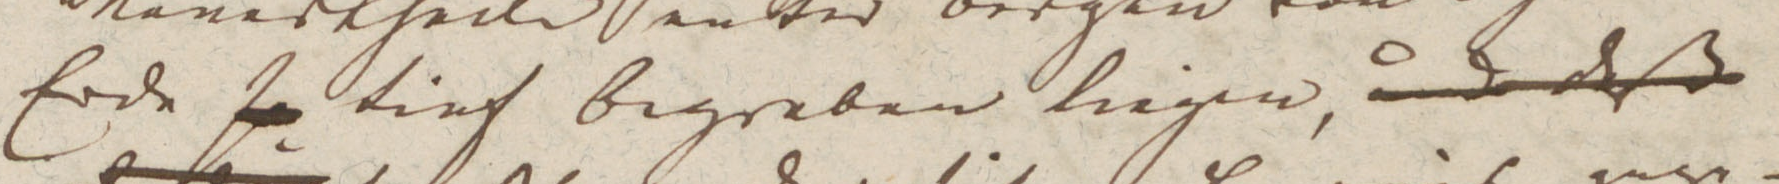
Erde so tief begraben liegen, und dass
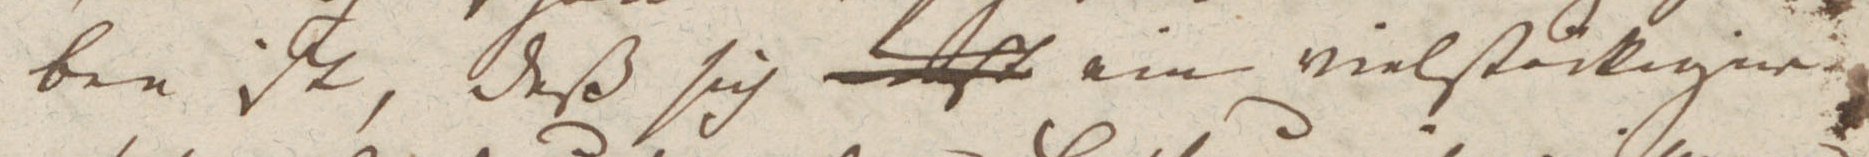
ben ist, dass sich erst ein vielstöckiger
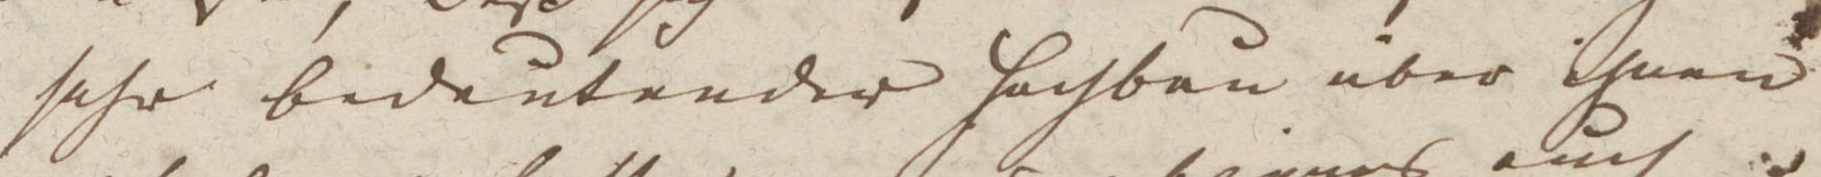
sehr bedeutender Hochbau über ihnen
